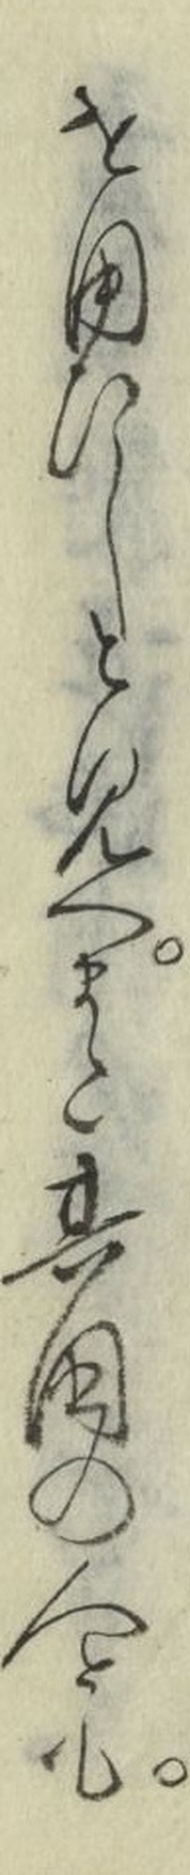を用ひしと見へ。また其国の人とも。
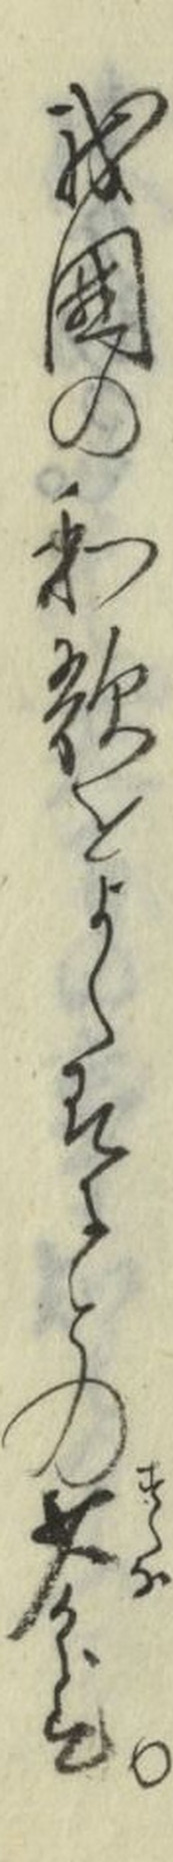我国の和歌をよくするもの少からす。
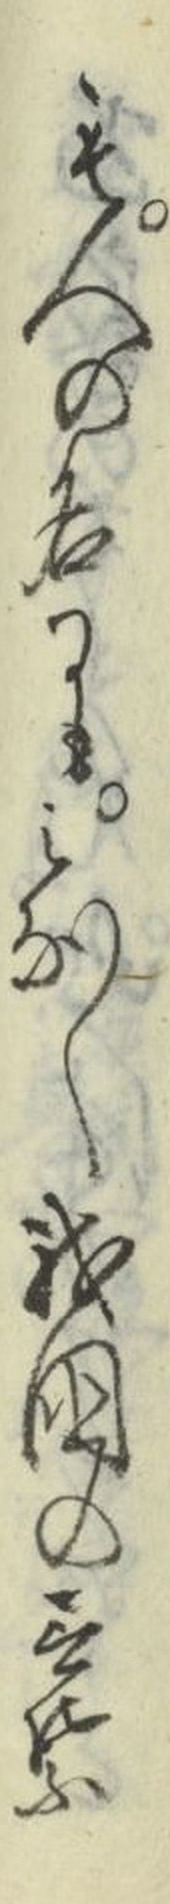も。人の名にも。みな〳〵我が国の言葉
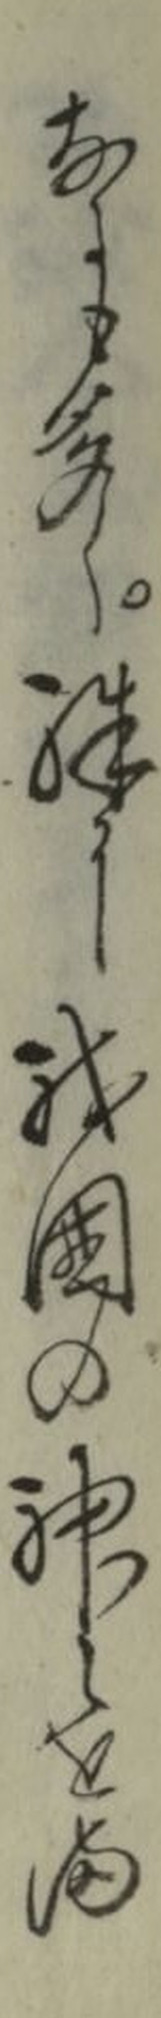なるも多し。誠に我国の神々をま
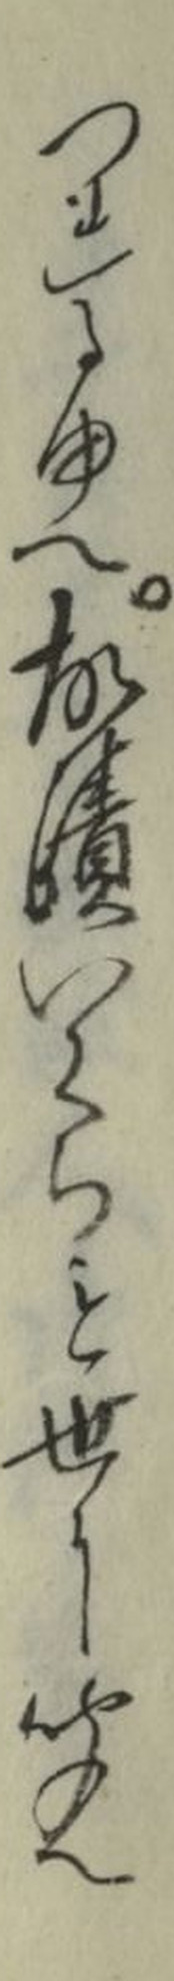つれるゆへ。故蹟いくらも世に聞へ
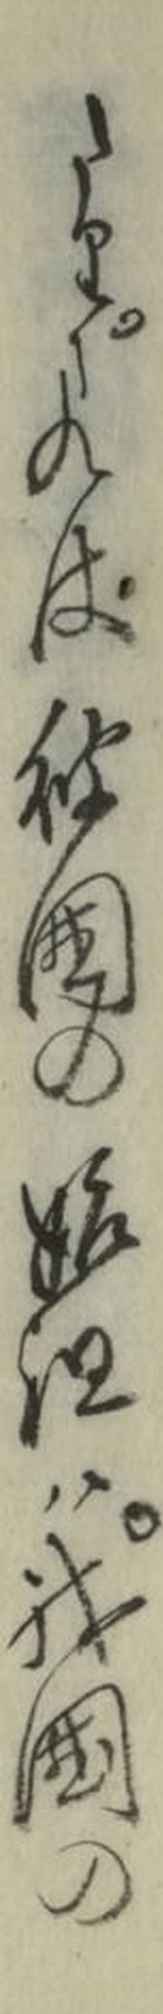たり。されは彼国の始祖は。我国の
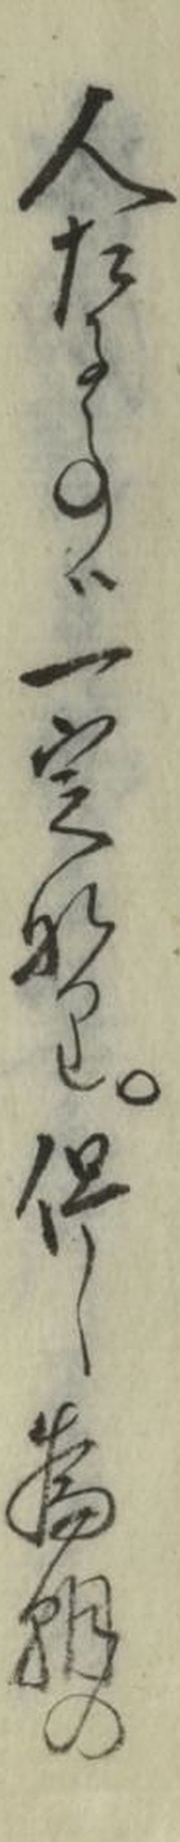人たる事は一定なり。但し為朝の
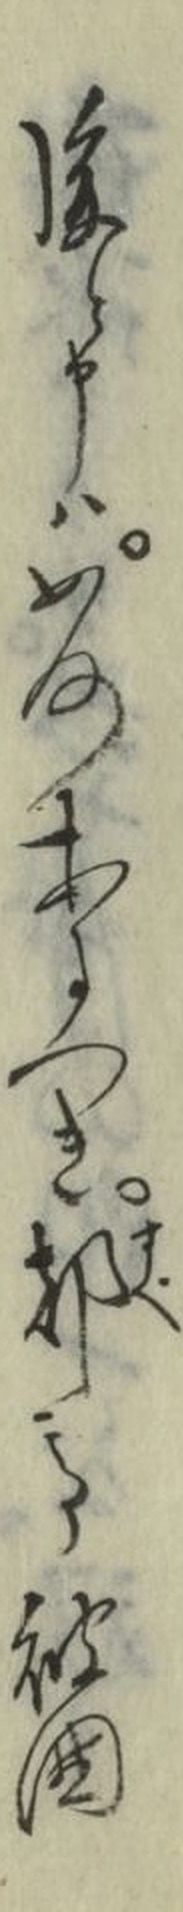後と申は。如何あるへき。都て彼国
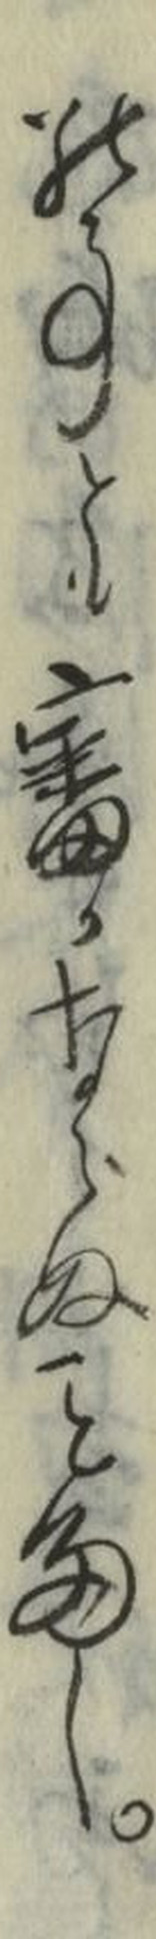の事とも審りならぬこと多し。

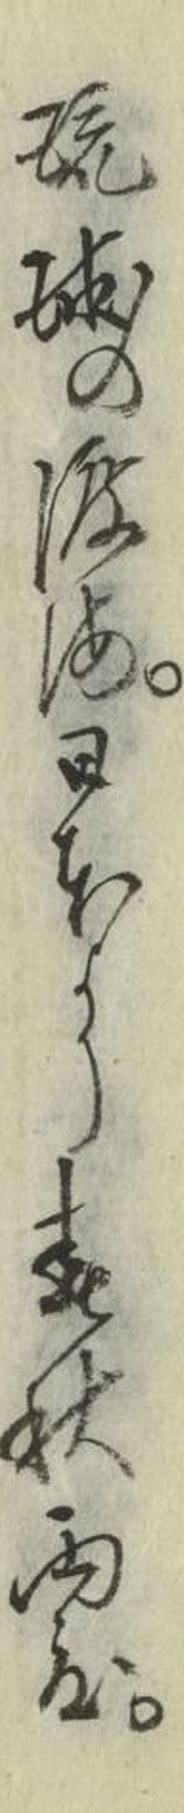琉球の渡海。日本より春秋両度。
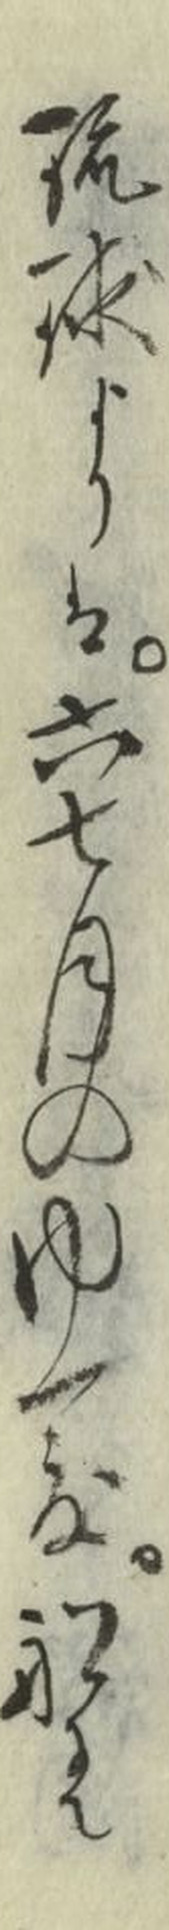琉球よりは。六七月の内一度。船にて
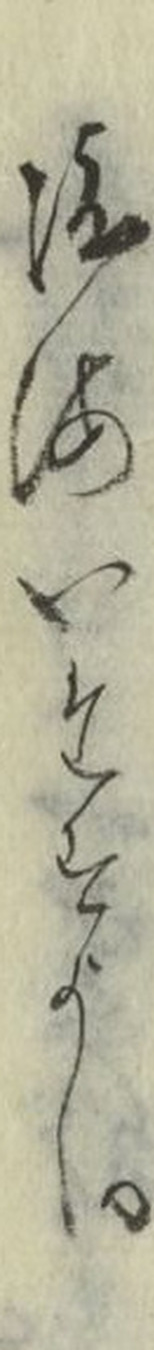渡海いたすよし。
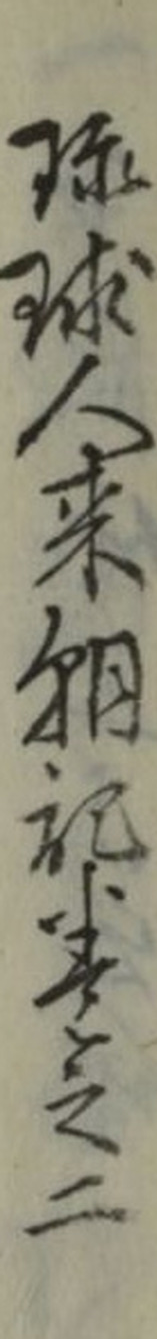琉球人来朝記巻之二
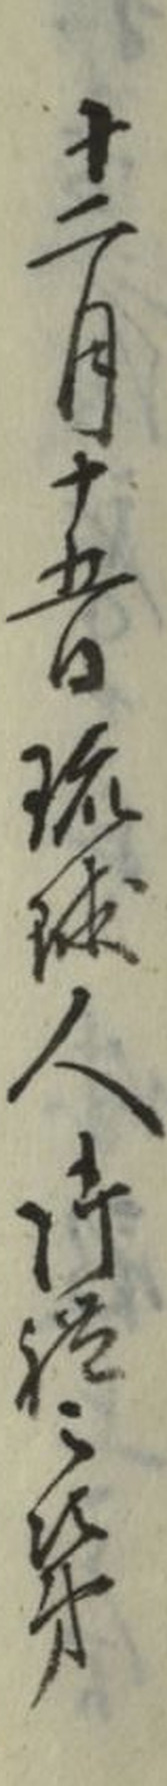十二月十五日琉球人御礼之次第
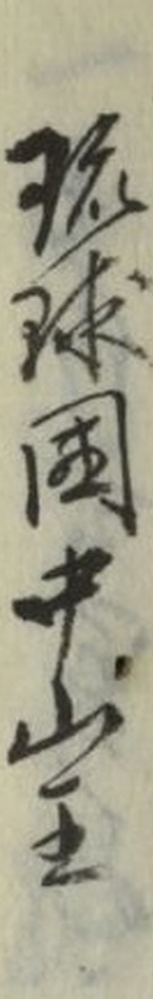琉球国中山王
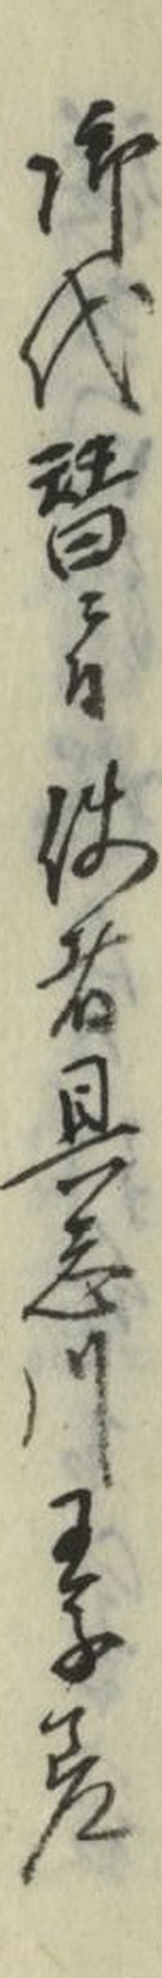御代替に付使者具志川王子差
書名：琉球人来朝記 一之二
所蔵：University of the Ryukyus Library
